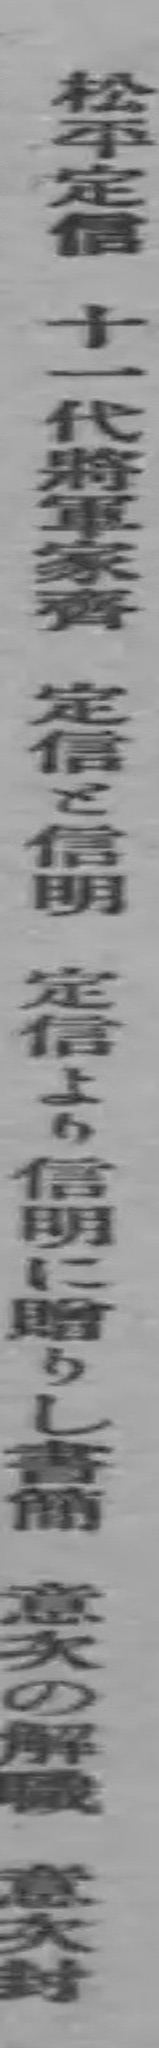松平定信十一代将軍家斉定信と信明定信より信明に贈りし書簡意次の解職意次封
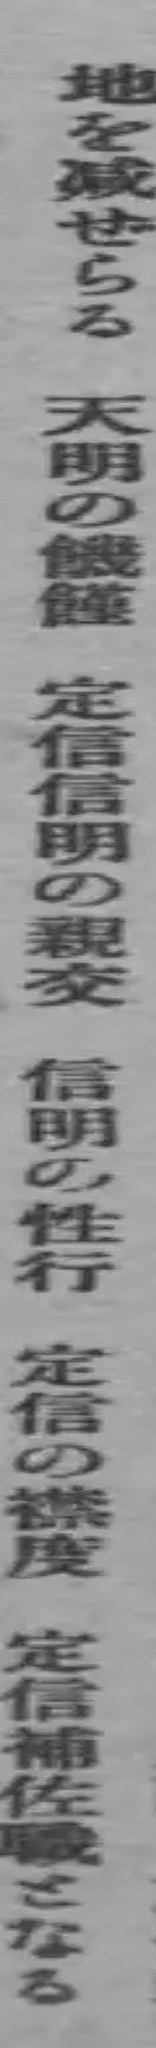地を減ぜらる天明の饑饉定信信明の親交信明の性行定信の襟度定信補佐職となる
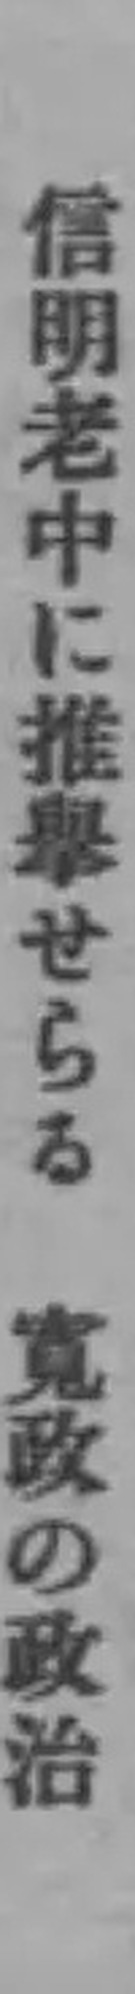信明老中に推挙せらる寛政の政治
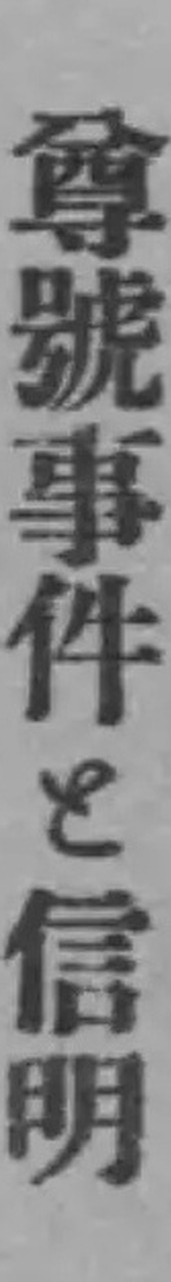尊号事件と信明
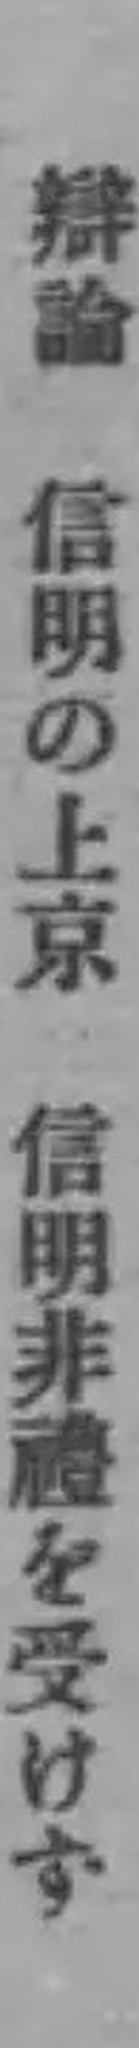弁論信明の上京信明非礼を受けず
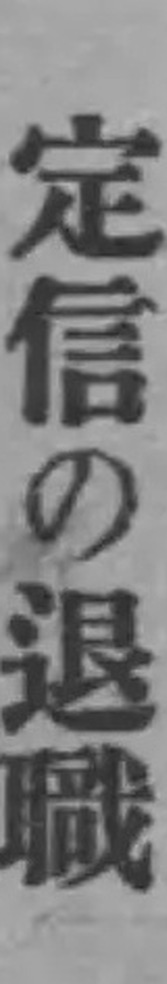定信の退職
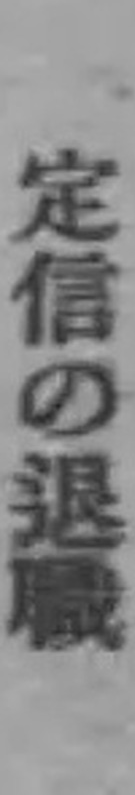定信の退職
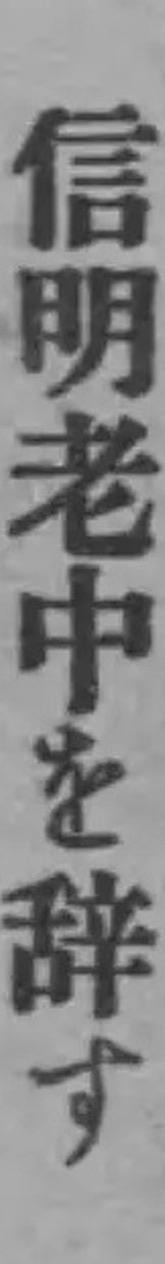信明老中を辞す
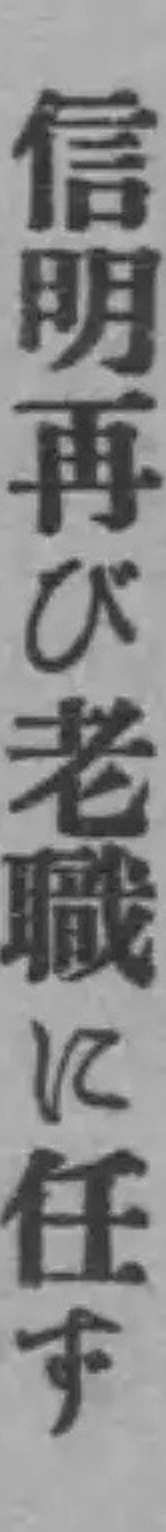信明再び老職に任ず
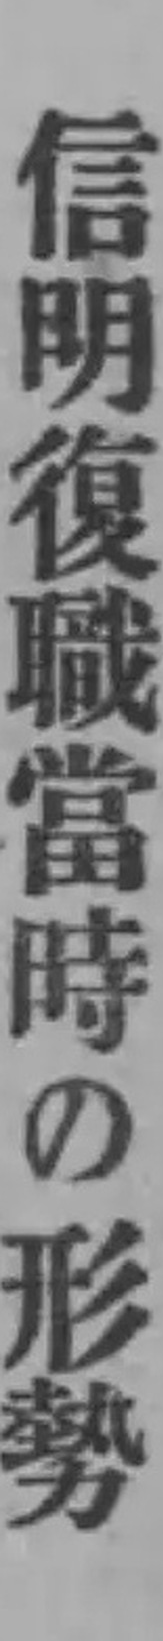信明復職当時の形勢
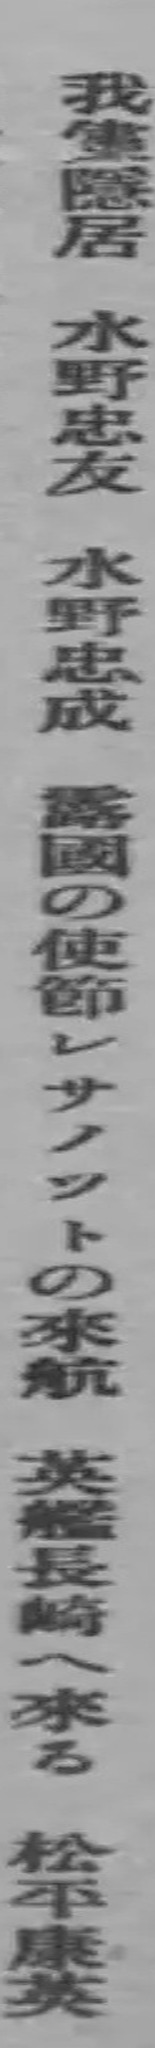我隻隠居水野忠友水野忠政露国の使節レサノツトの来航英艦長崎へ来る松平康英
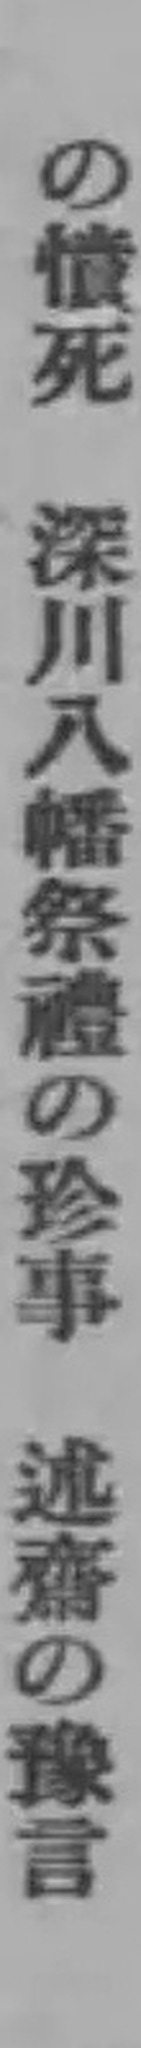の憤死深川八幡祭礼の珍事述斉の予言
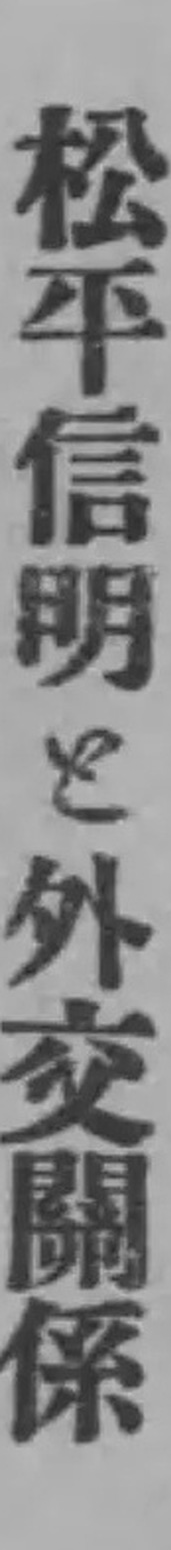松平信明と外交関係
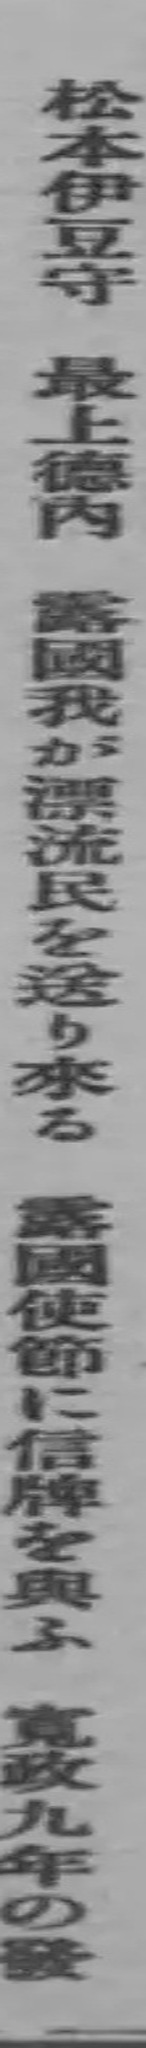松本伊豆守最上徳内露国我が漂流民を送り来る露国使節に信牌を与ふ寛政九年の発
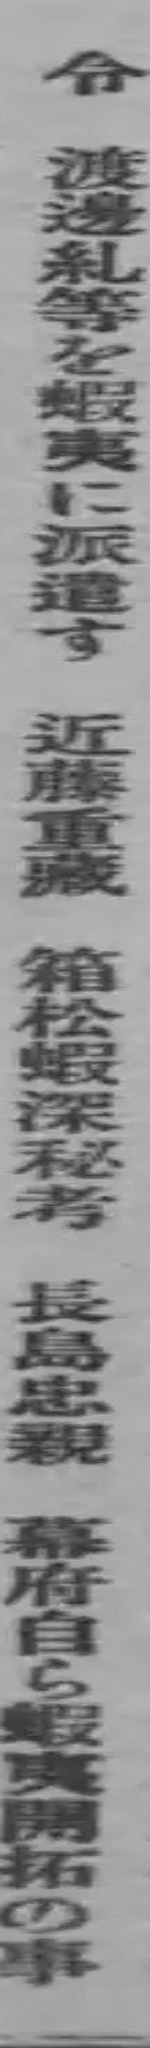令渡邊糺等を蝦夷に派遣す近藤重蔵箱松蝦深秘考長島忠親幕府自ら蝦夷開拓の事
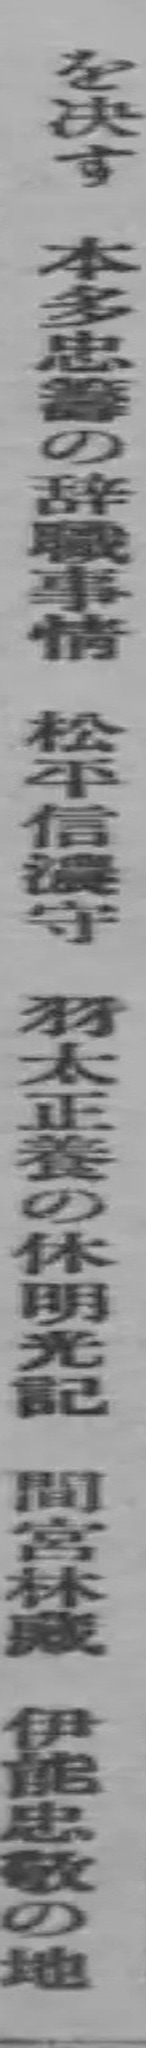を決す本多忠籌辞職事件松平信濃守羽太正養の休明光記間宮林蔵伊能忠敬の地
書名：豊橋市史談
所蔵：国立国会図書館 National Diet Library, JAPAN
